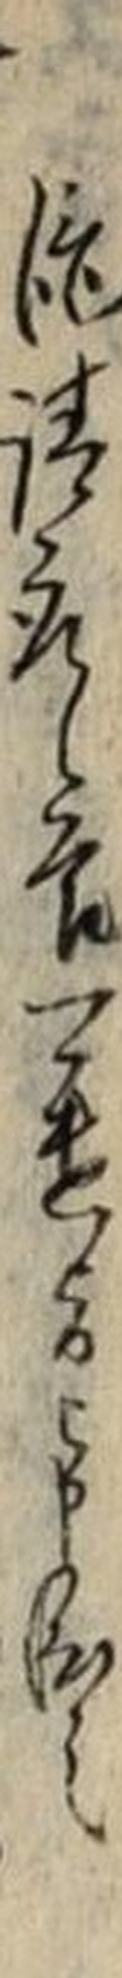添請取候節可遣旨被申渡之
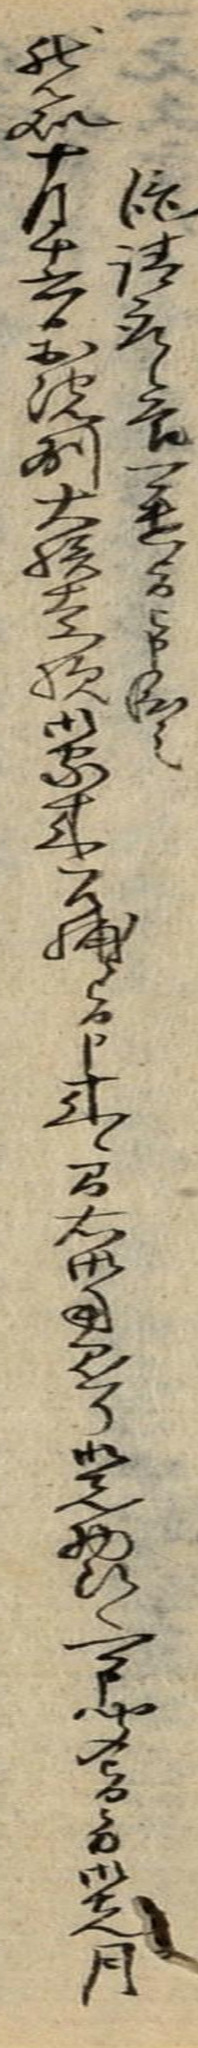然ル処十月十六日於濃州大膳大夫様御家来召捕候旨申来候間右御用懸り御先物頭へ可申聞旨に付御先月
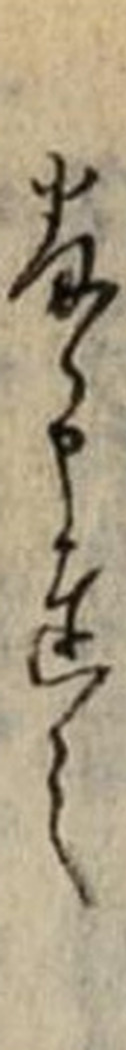番へ申達之
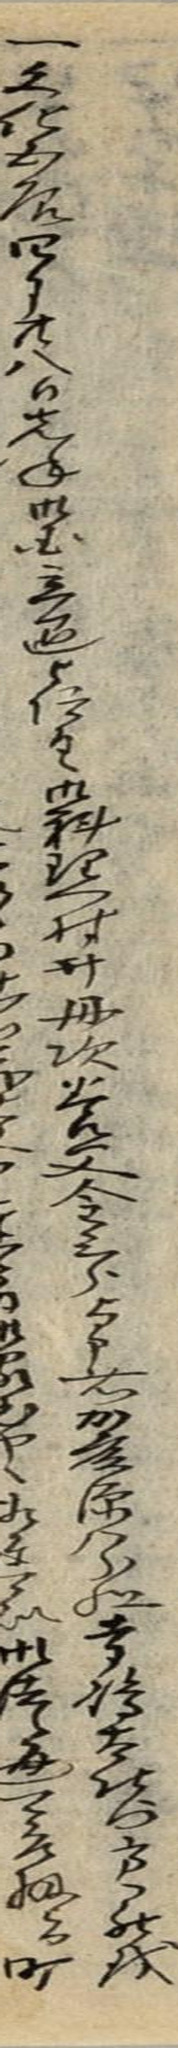一文化五辰四月廿八日先年御国立退被仰付候御料理人村井丹次養父金三郎と申者加藤源八郎組多島太次右衛門方へ罷越
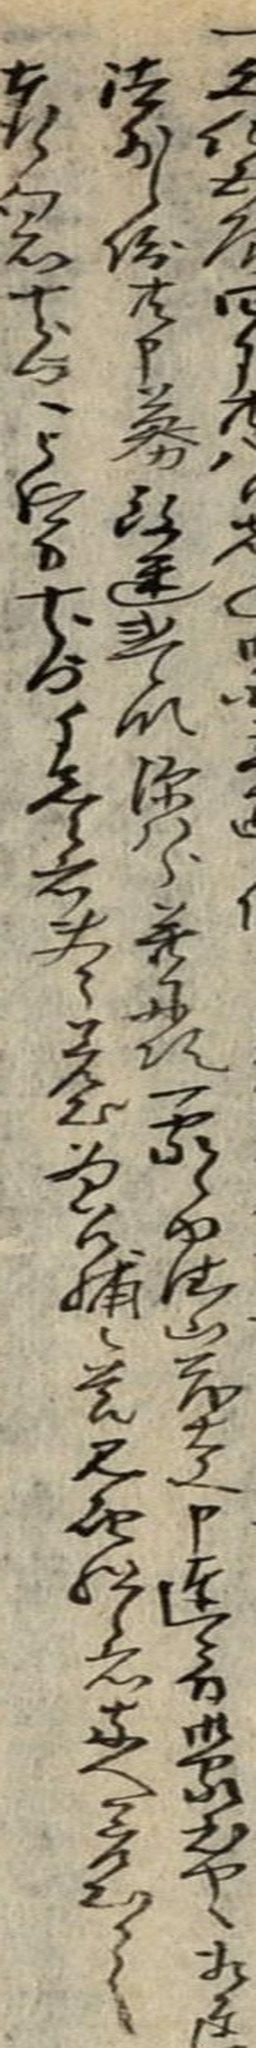奉行白石十郎右衛門へ被仰付十郎右衛門手先之者夫々差出為召捕候節見届組之者両人差出之
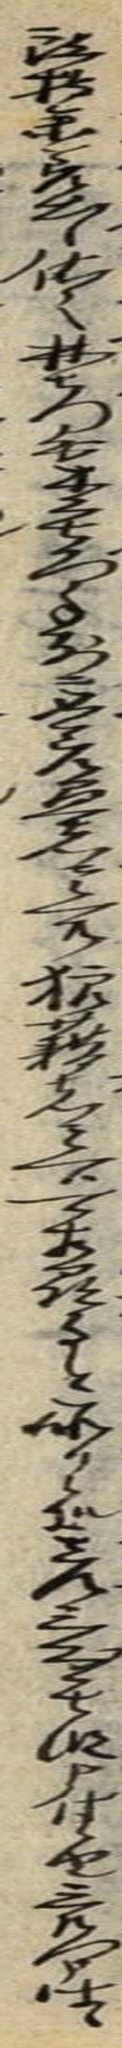致持参差出候依之林右衛門義杢右衛門手前に不差置者に候へ共狼藉者に候へは可相尋事と承り候処彦三義其段申付候由三左衛門申聞候
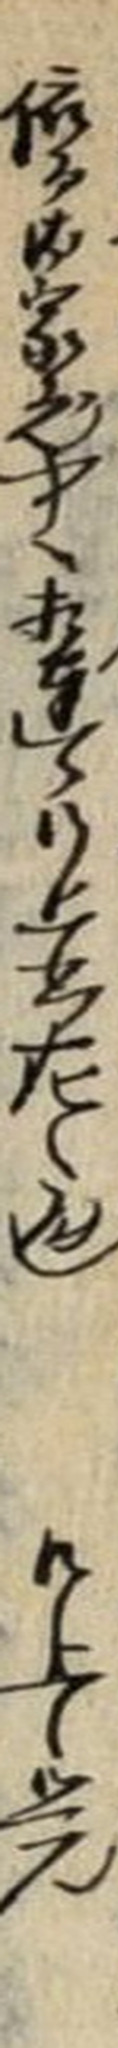依て御家老中へ相達候口上書左之通口上之覚
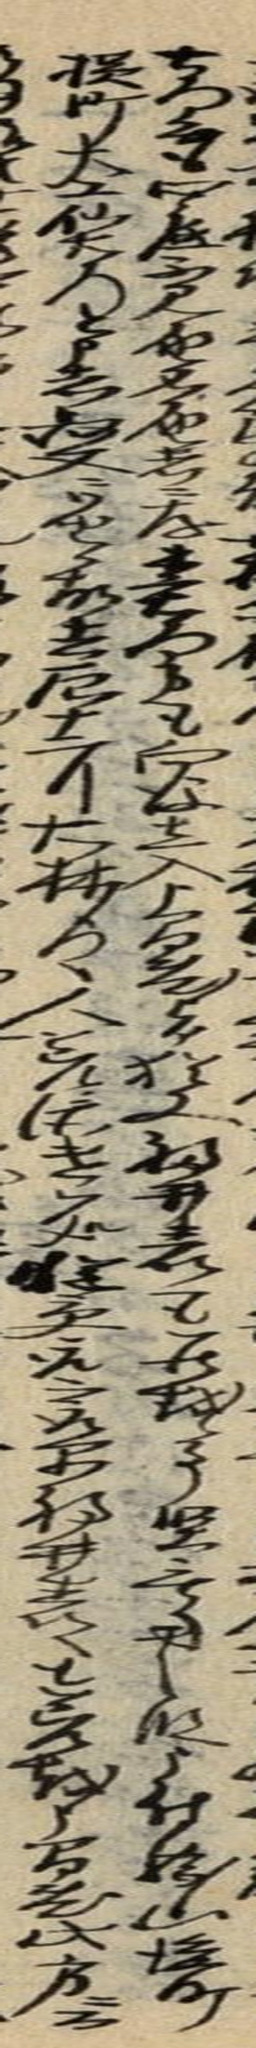横町大工仙右衛門と申者叔父に御座候故去辰十二月右林右衛門へ人差添遣候処慥受取最早福井表へも差越申間敷此方にて
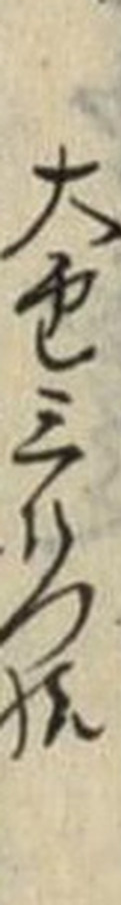大野三左衛門様
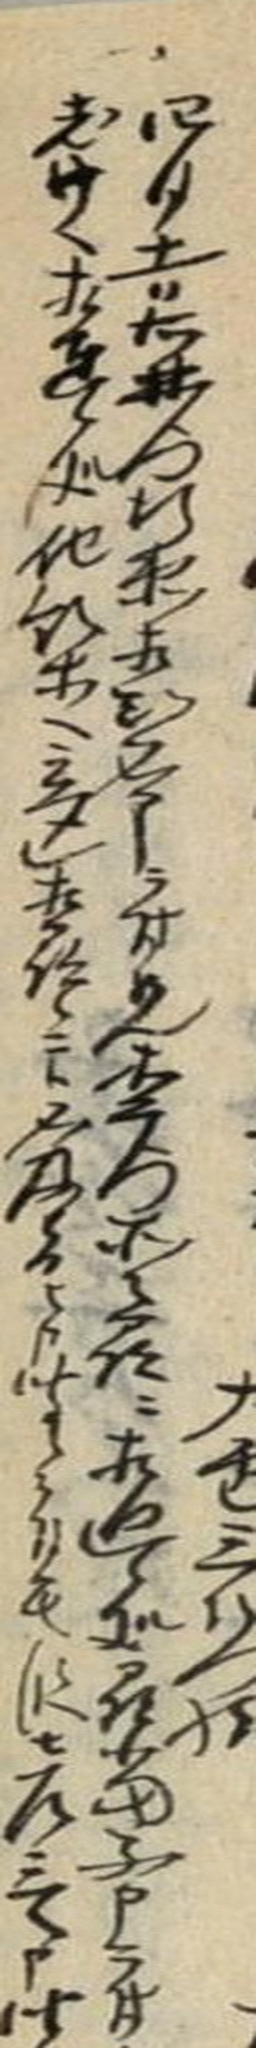老中へ相達候処他領等へ立込相尋候には不及旨被申聞候に付其段彦三へ申聞之
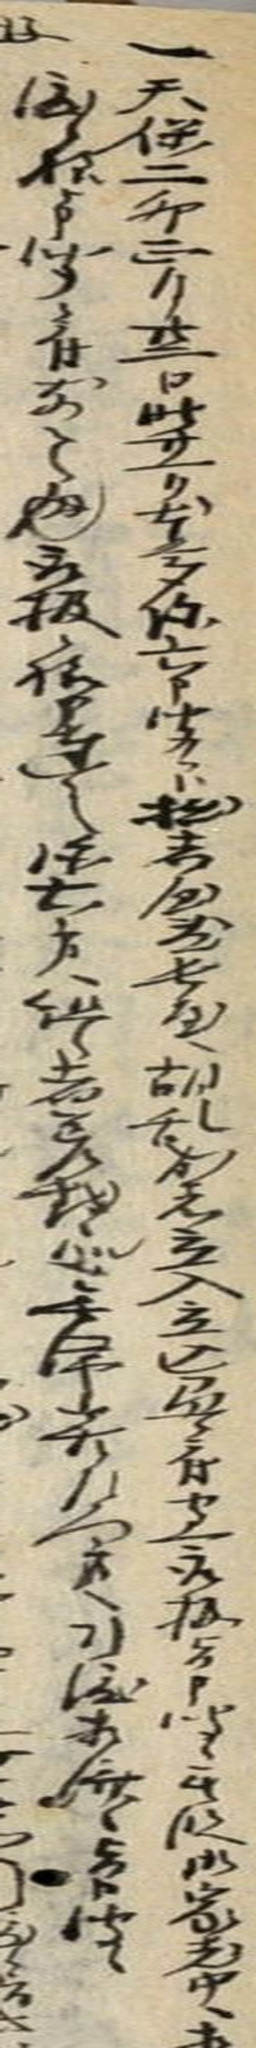渡候様被申聞候に付前々之通取扱候様申達之弥六方へ組之者差越候処無滞善左衛門方へ引渡相済候旨申聞候

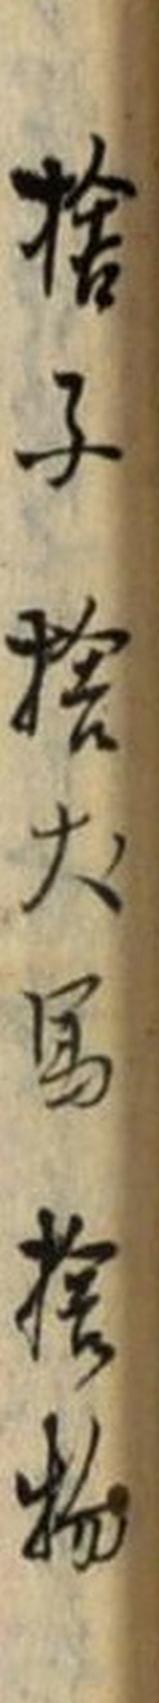捨子捨犬馬捨物
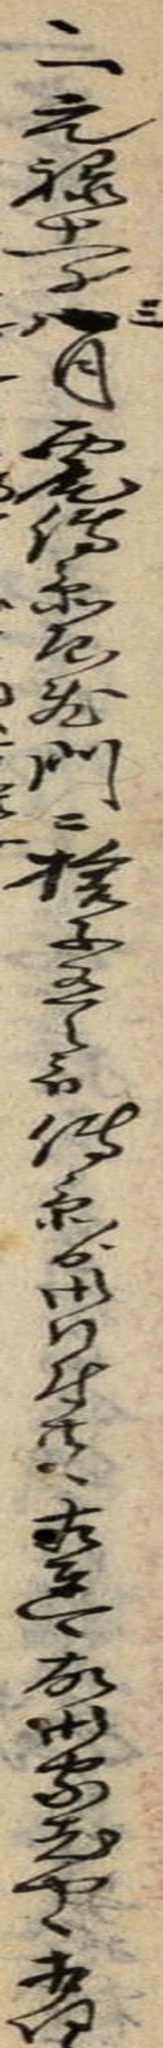一元禄十一刁三月西尾伝兵衛屋敷門に捨子有之に付伝兵衛ゟ御目付共へ相達候故御家老中へ相伺候
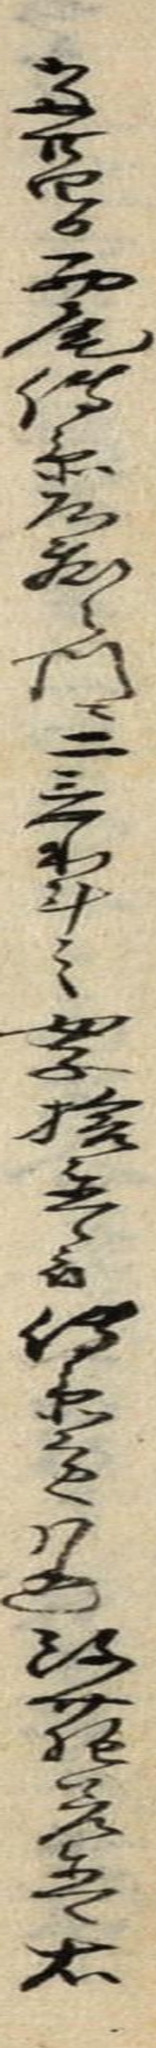当廿四日西尾伝兵衛屋敷之門に二三歳斗之女子捨置候に付伝兵衛方へ引込致介抱差置候右
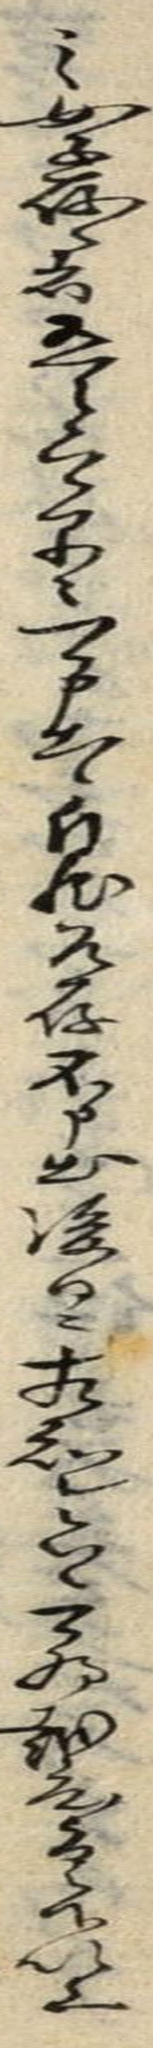之女子存候者有之候はゝ早々可申出候自然乍存不申出後日に相知レ候はゝ可為越度旨に候以上
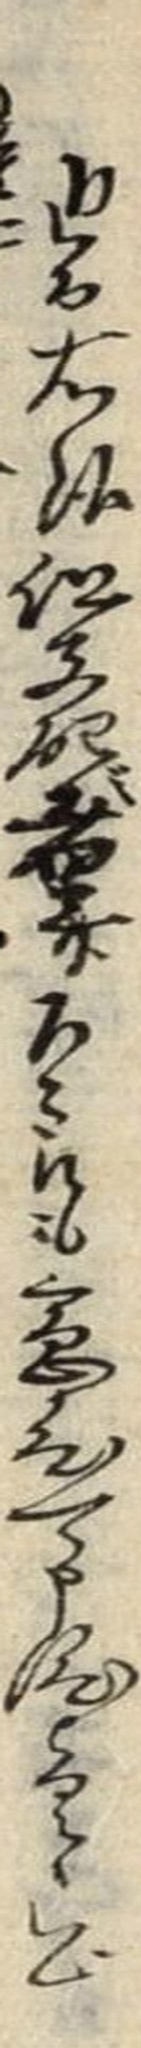追て右趣組支配之者并下々えも急度可申渡旨に候以上
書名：御停止異変死失
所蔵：福井県文書館 Fukui Prefectural Archives
